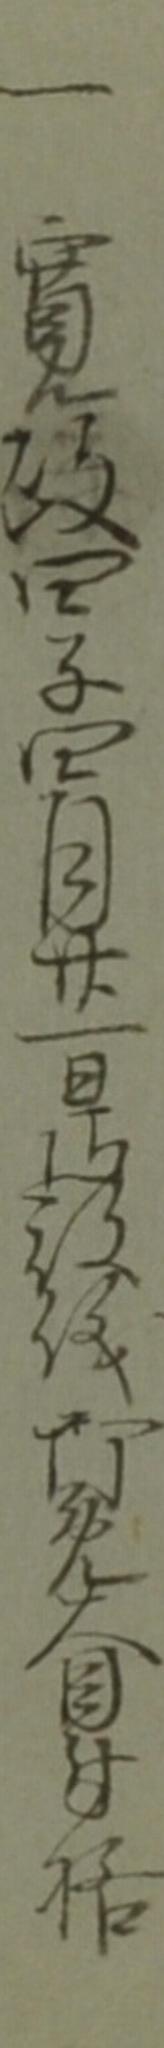一寛政四子四月廿一日御役儀御免大目付格
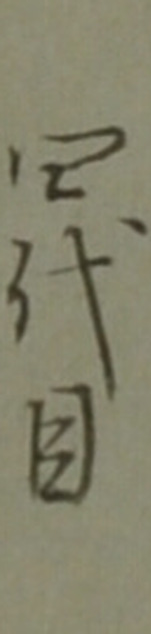四代目
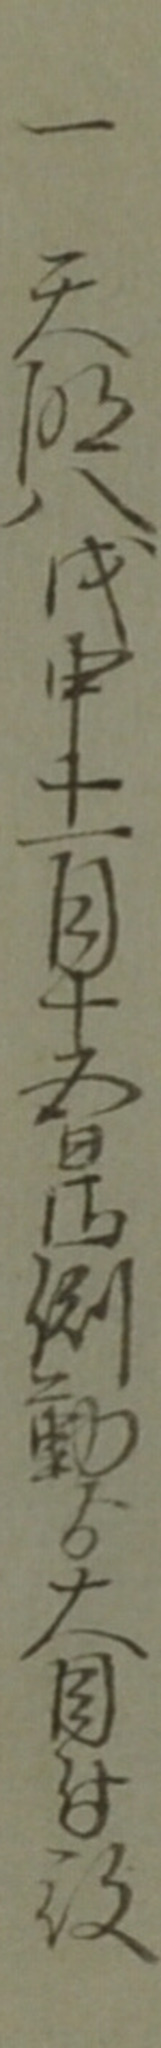一天明八戊申十一月十五日御側勤ゟ大目付役
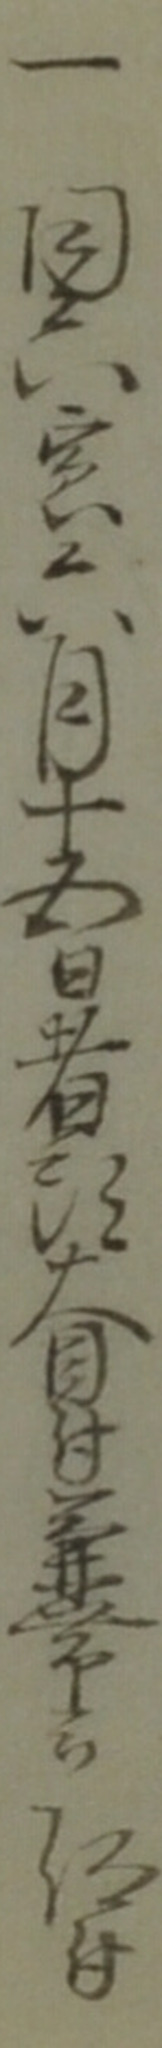一同六寅六月十五日者頭大目付兼帯被仰付
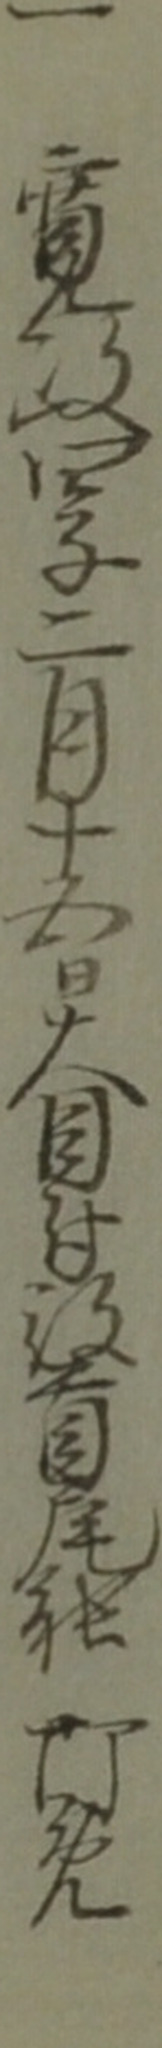一寛政四子二月十五日大目付役首尾能御免
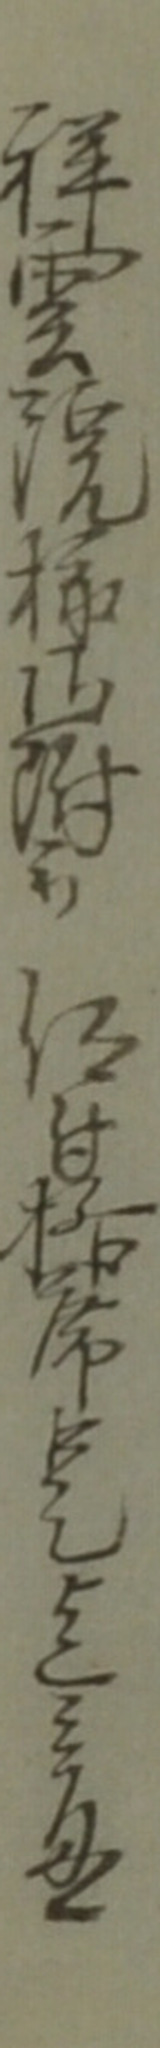祥雲院様御附被仰付格席是迄之通
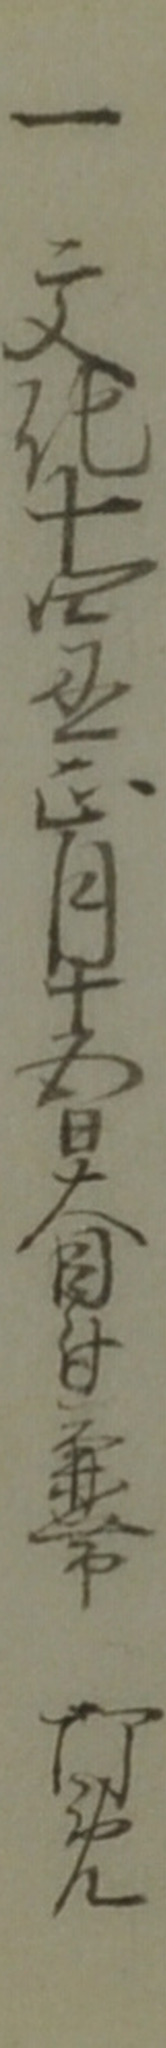一文化十四丑正月十五日大目付兼帯御免
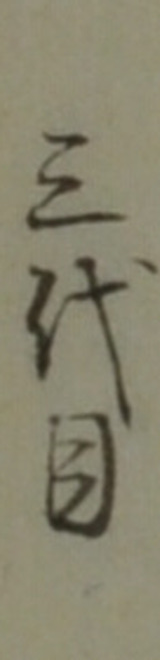三代目
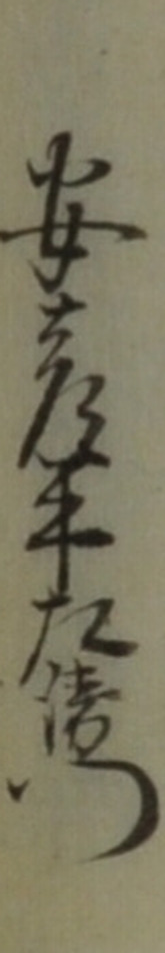安彦平左衛門
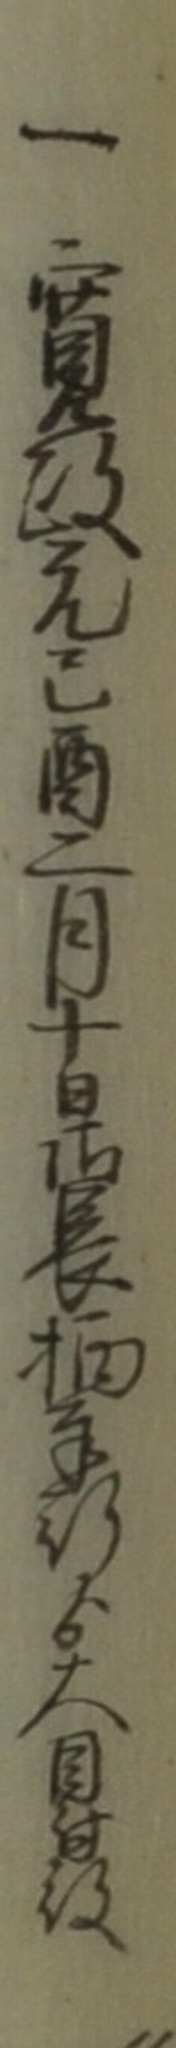一寛政元己酉二月十日御長柄奉行ゟ大目付
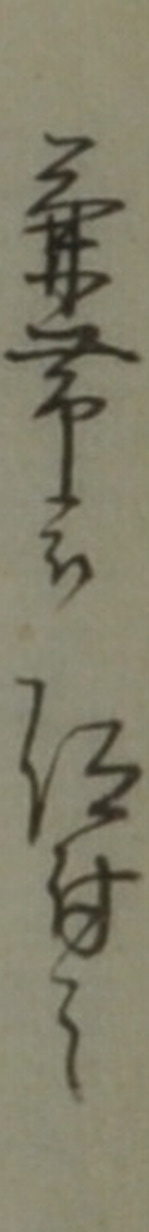兼帯被仰付之
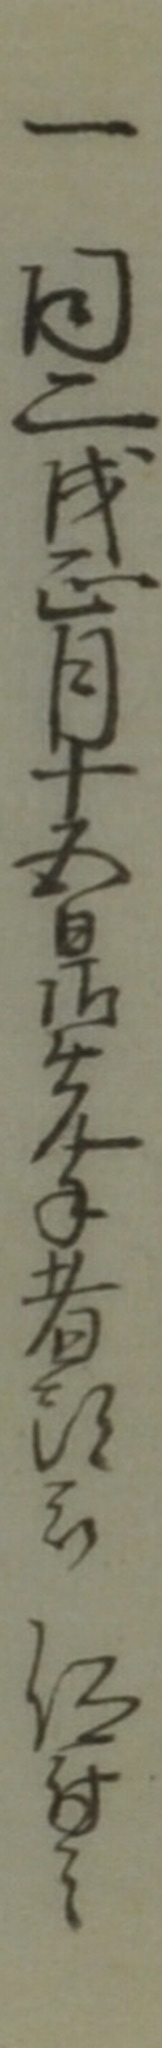一同二戌正月十五日御先手者頭被仰付之
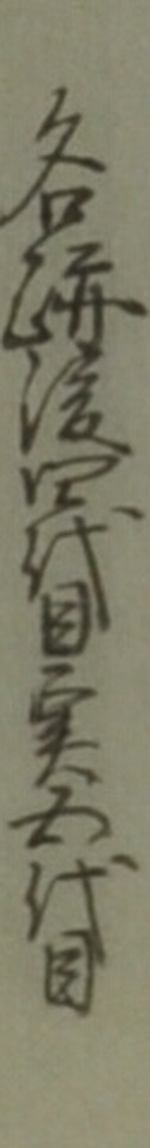名跡後四代目実五代目
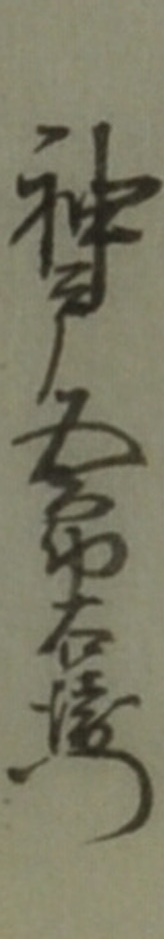神戸五郎右衛門
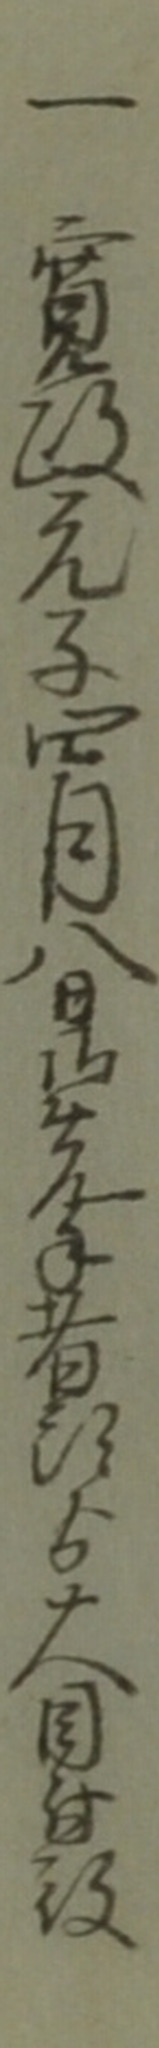一寛政元子四月八日御先手者頭ゟ大目付役
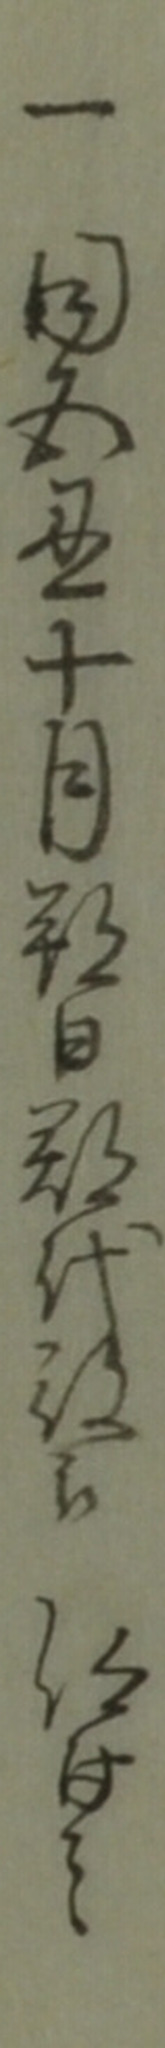一同五丑十月朔日郡代役被仰付之
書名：諸御役代々録（三）
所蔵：伊那市立高遠町図書館・合同会社AMANE
